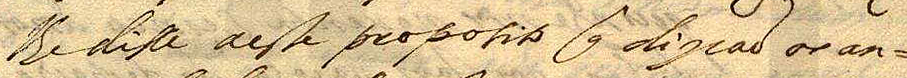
lhe disse a este proposito q̄ diziaõ os an
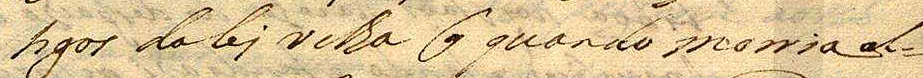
tigos da lej velha q̄ quando morria al
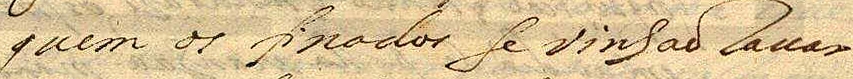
guem os finados se vinhaõ lauar
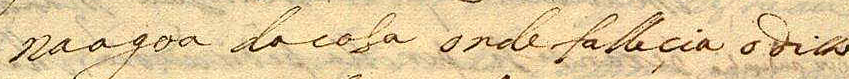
na agoa da casa onde falleçia o ditto
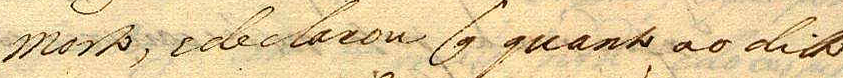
morto, E declarou q̄ quanto ao ditto
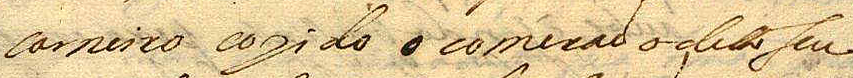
carneiro cozido o comeraõ o ditto seu
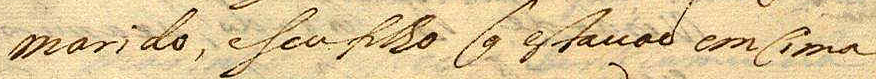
marido, e seu filho q̄ estauaõ em Cima
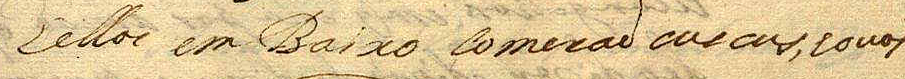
E ellas em Baixo comeraõ cuscus, E ouos
